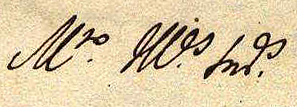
M.to Ill.es Snr.es
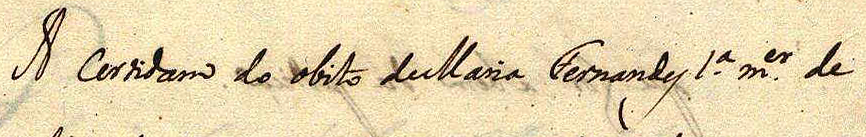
A Certidam do obito de Maria Fernandes 1.a m.er de
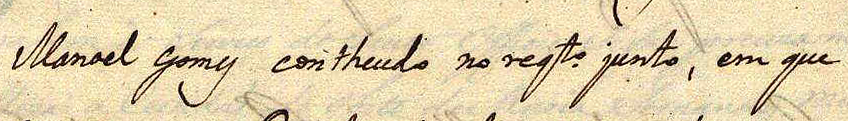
Manoel Gomes contheudo no req.to junto, em que
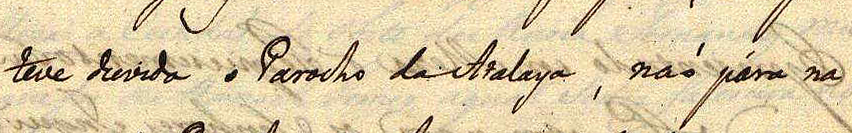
teve duvida o Parocho da Atalaya, naõ pára na
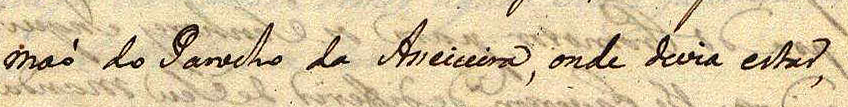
maõ do Parocho da Asseiceira, onde devia estar
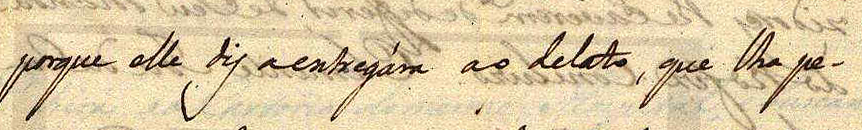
porque elle dis a entregára ao delato, que lha pe
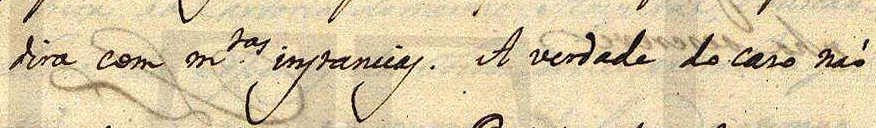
dira com m.tas instancias. A verdade do caso naõ
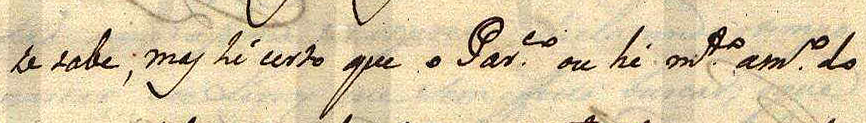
se sabe; mas hé certo que o Par.co ou hé m.to am.o do
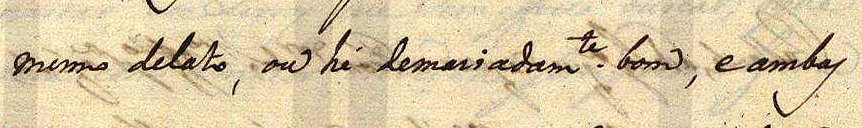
mesmo delato, ou hé demasiadam.te bom, e ambas
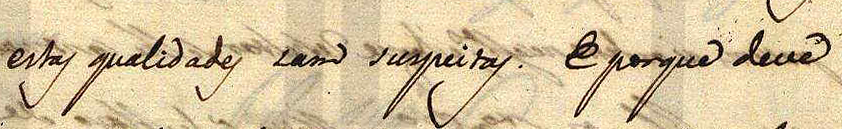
estas qualidades sam suspeitas. E porque deve
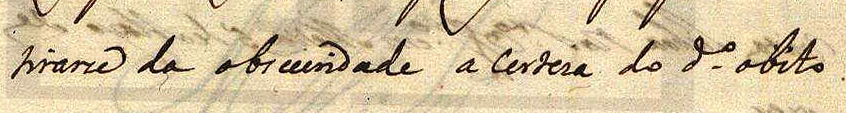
tirarse da obscuridade a certeza do d.o obito
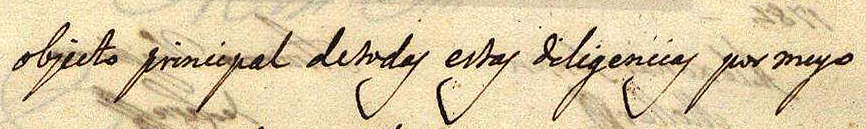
objeto principal de todas estas deligencias por meyo
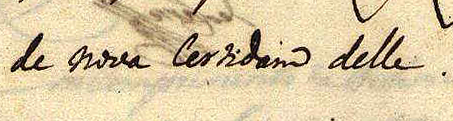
de nova Certidam delle.
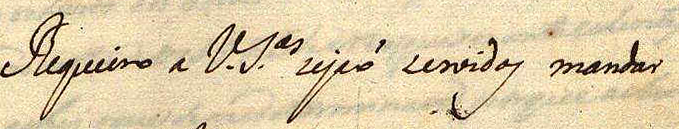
Requeiro a V. S.as sejaõ servidas mandar
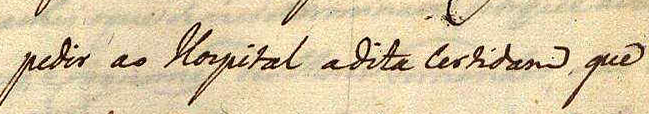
pedir ao Hospital a dita certidam, que
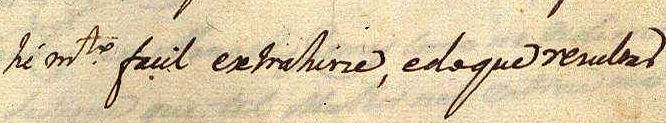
hé m.to facil extrahirse, e do que resultar
